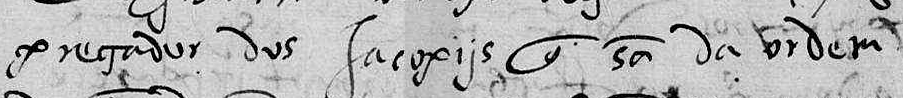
pregador dos Jacopijs q̄ sā da ordem
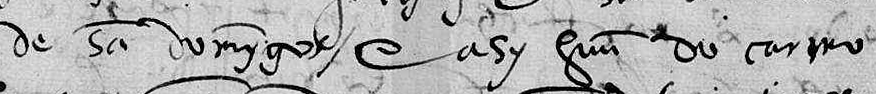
de sā dom̄ygos / e asy huū do carmo
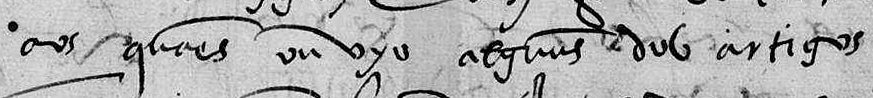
aos qūaes ouvyo alguūs dos artigos
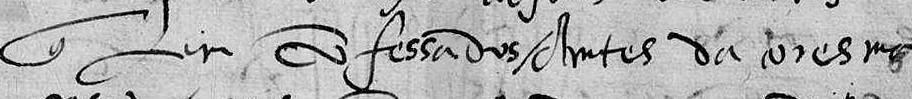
q̄ tem cōfessados / Amtes da coresma
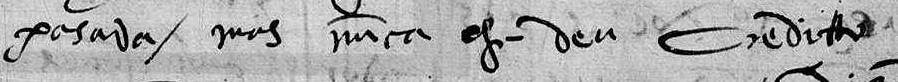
pasada / mas nūca lhe deu Creditto
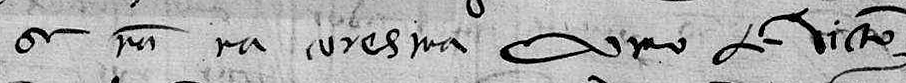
se nā na coresma Como te dicto
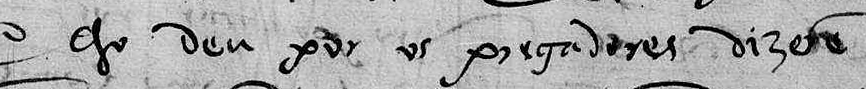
e lho deu por os pregadores dizerē
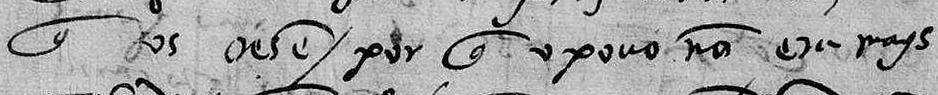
q̄tos cresē / por q̄ o pouo nā era majs
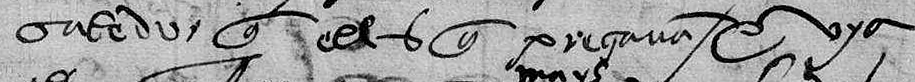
sabedor q̄ elles q̄ pregauā / e vya
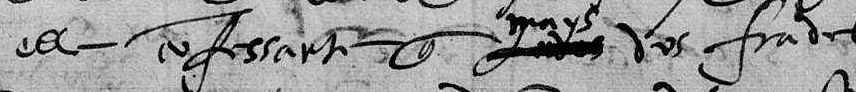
elle cōfessante q̄ mays dos frades
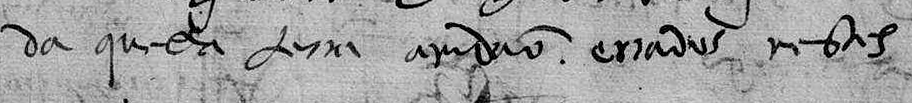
daquella terra amdaõ. errados nestes
